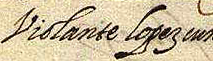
Violante lopez cunh.
